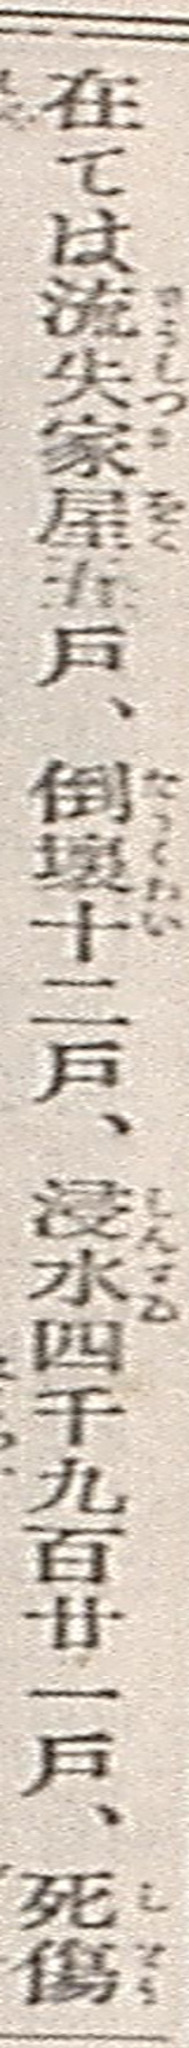在ては流失家屋五戸、倒壊十二戸、浸水四千九百廿一戸、死傷
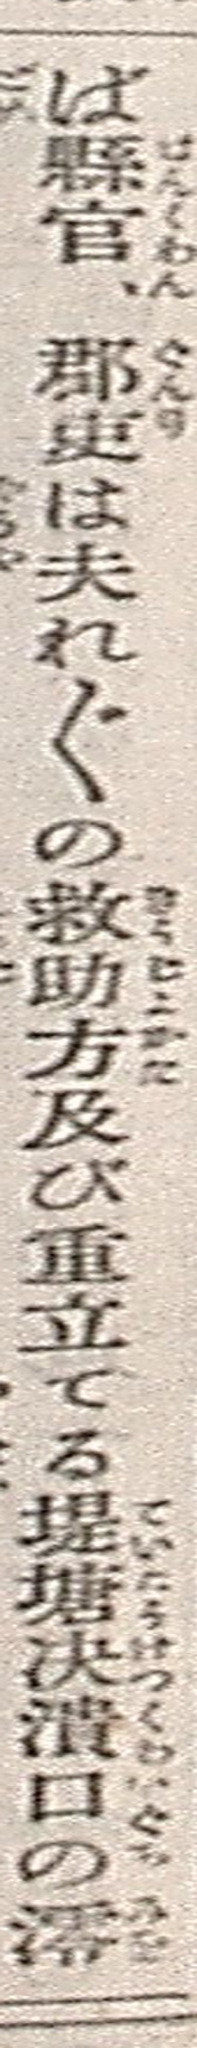ば県官、郡吏は夫れ〴〵の救助方及び重立てる堤塘决潰口の澪
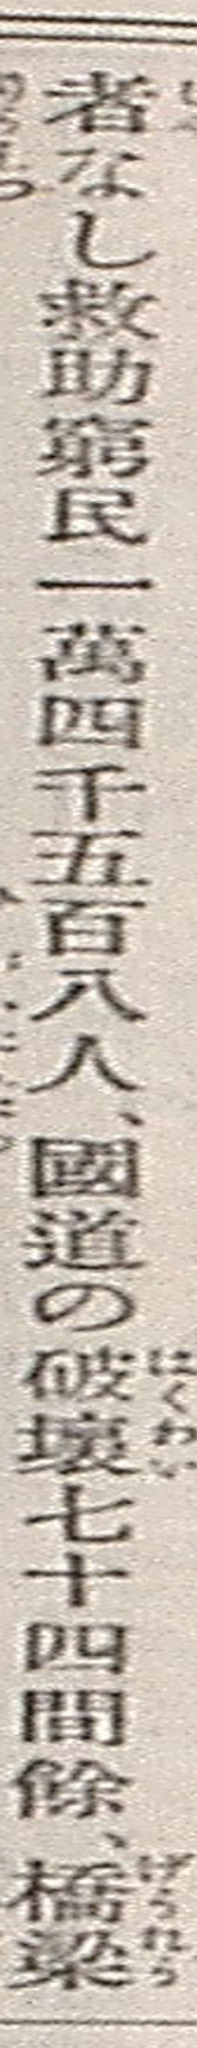者なし救助窮民一万四千五百八人、国道の破壊七十四間餘、橋梁
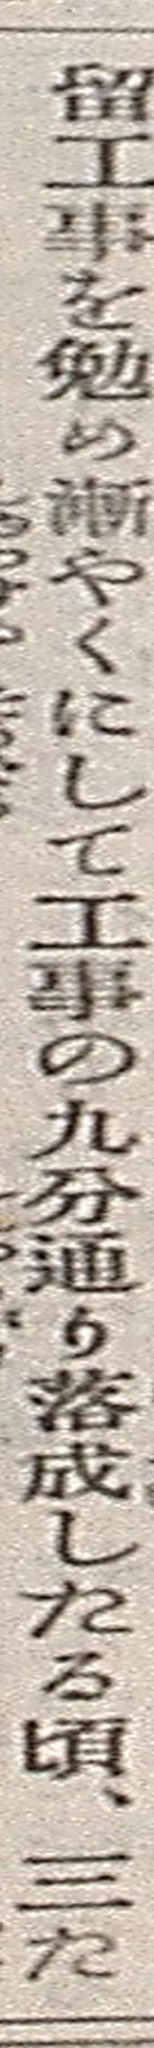留工事を勉め漸やくにして工事の九分通り落成したる頃、三た
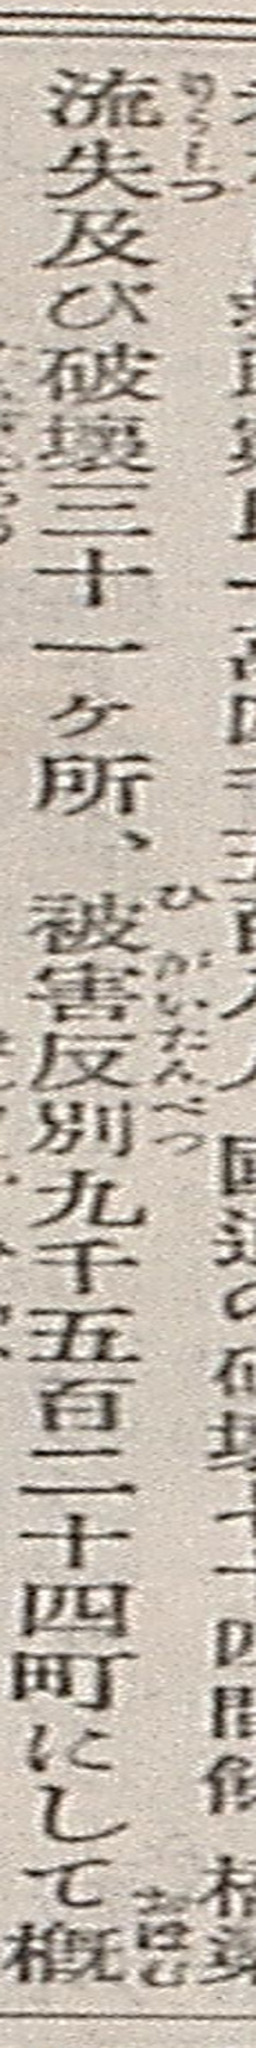流失及び破壊三十一ヶ所、被害反別九千五百二十四町にして概
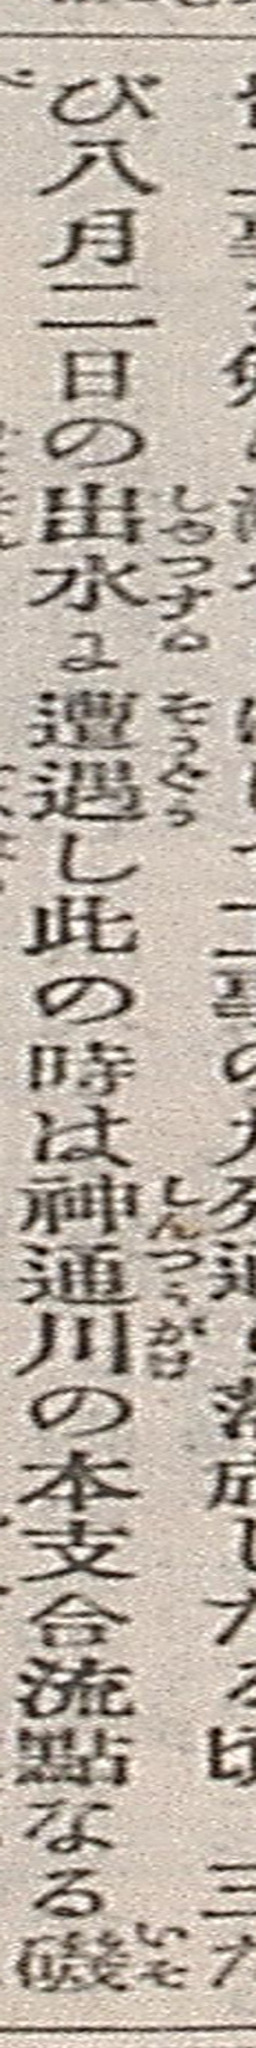び八月二日の出水に遭遇し此の時は神通川の本支合流点なる磯
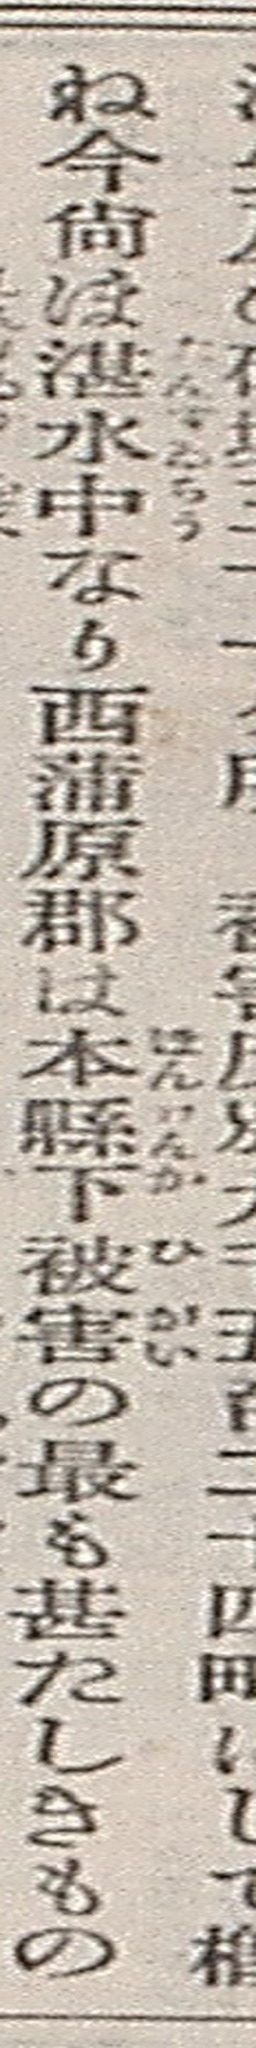ね今尚ほ湛水中なり西蒲原郡は本縣下被害の最も甚だしきもの
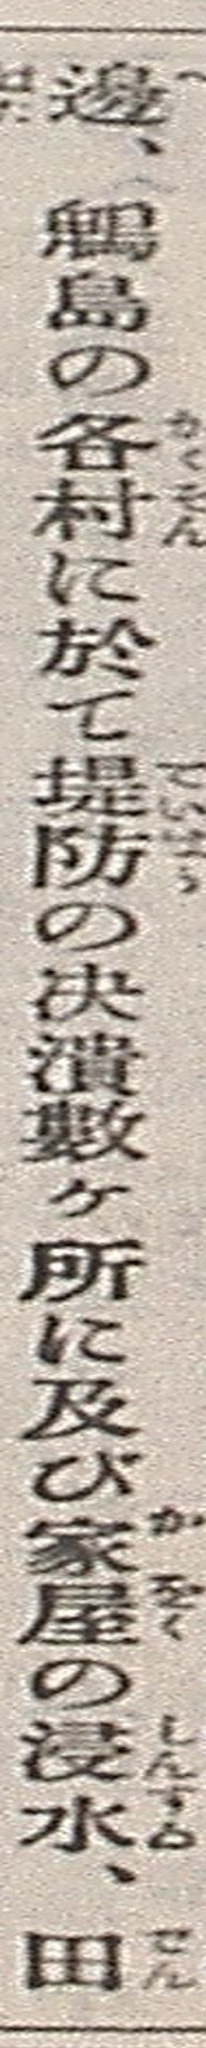辺、鵯島の各村に於て堤防の决潰数ヶ所に及び家屋の浸水、田
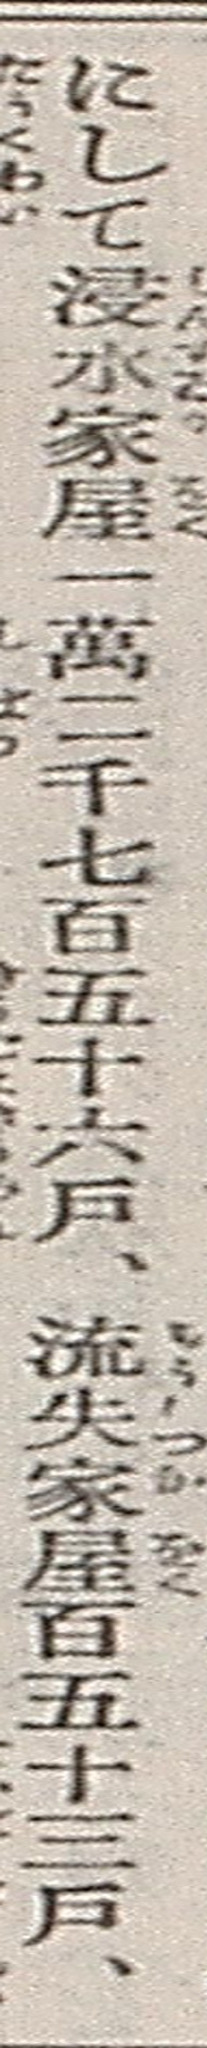にして浸水家屋一万二千七百五十六戸、流失家屋百五十三戸、
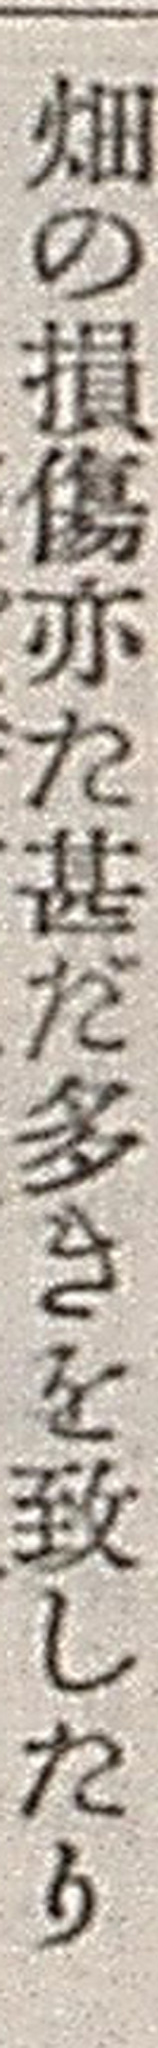畑の損傷亦た甚だ多きを致したり
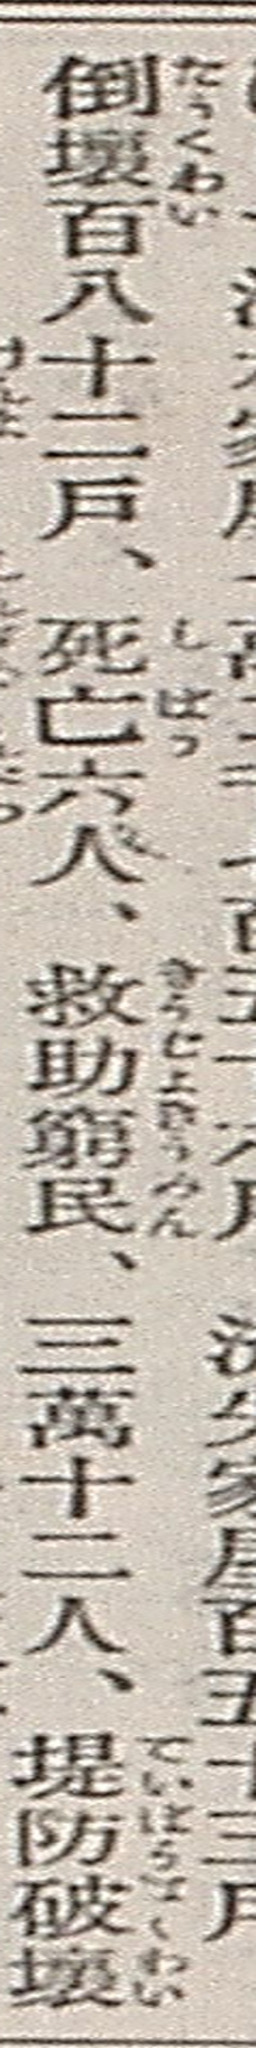倒壊百八十二戸、死亡六人、救助窮民、三万十二人、堤防破壊
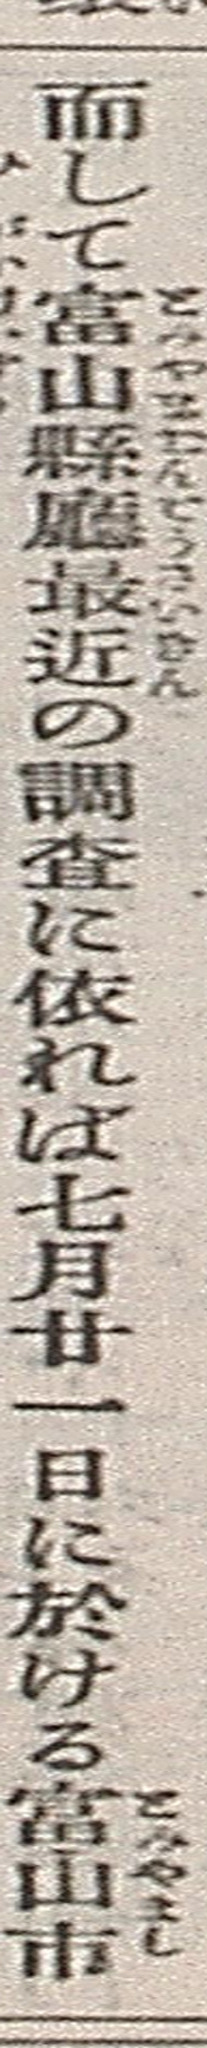而して富山県庁最近の調査に依れば七月廿一日に於ける富山市
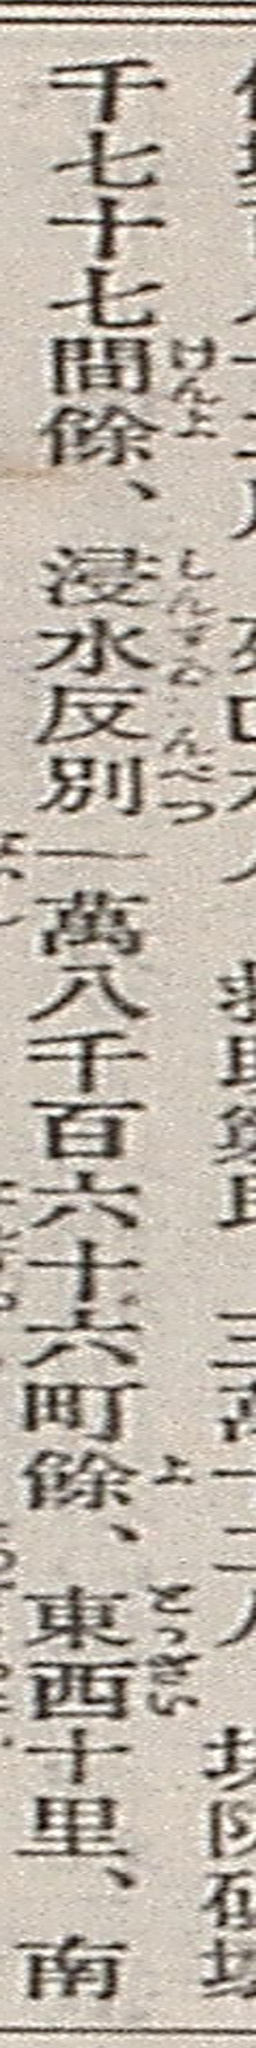千七十七間餘、浸水反別一万八千百六十六町餘、東西十里、南
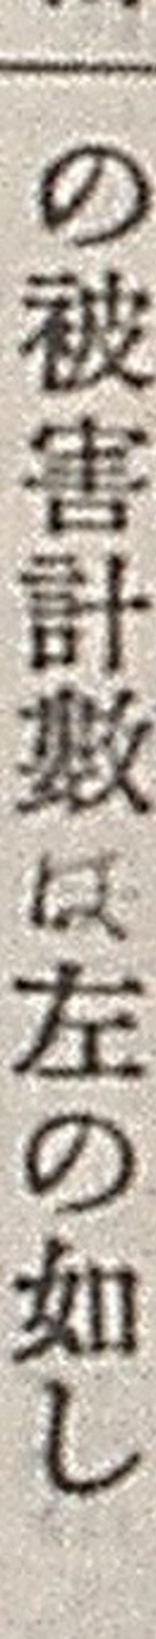の被害計数左の如し
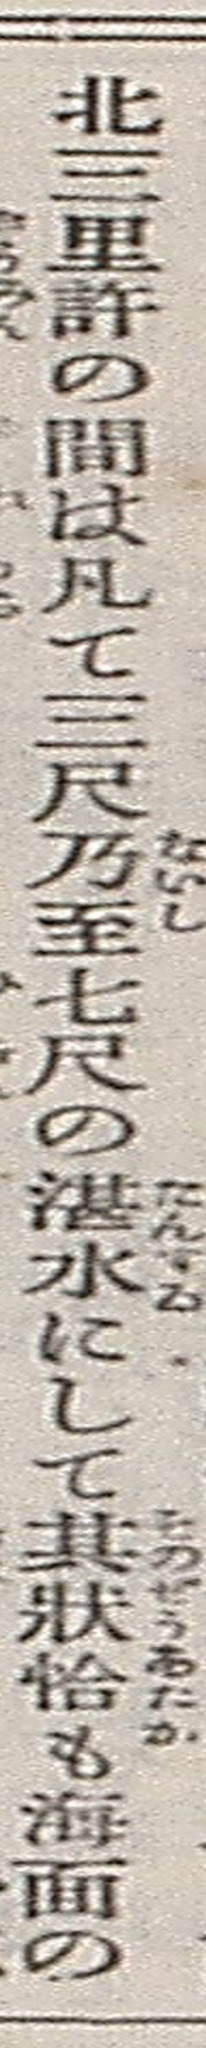北三里許の間は凡て三尺乃至七尺の湛水にして其状恰も海面の
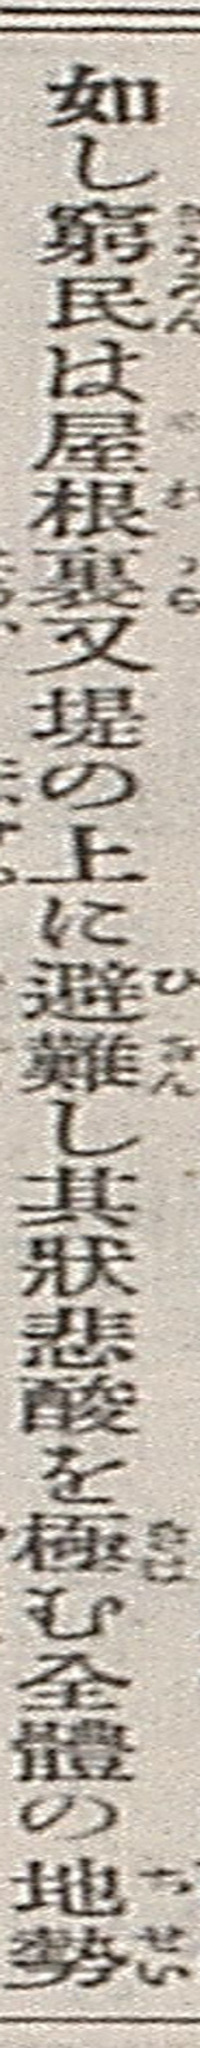如し窮民は屋根裏又堤の上に避難し其状悲酸を極む全体の地勢
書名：風俗畫報臨時増刊第百二十八號　洪水被害録（下）
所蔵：東京大学地震研究所図書室 Earthquake Research Institute Library, The University of Tokyo, JAPAN
